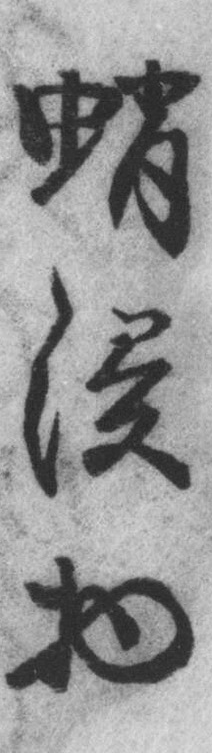蛸浸物
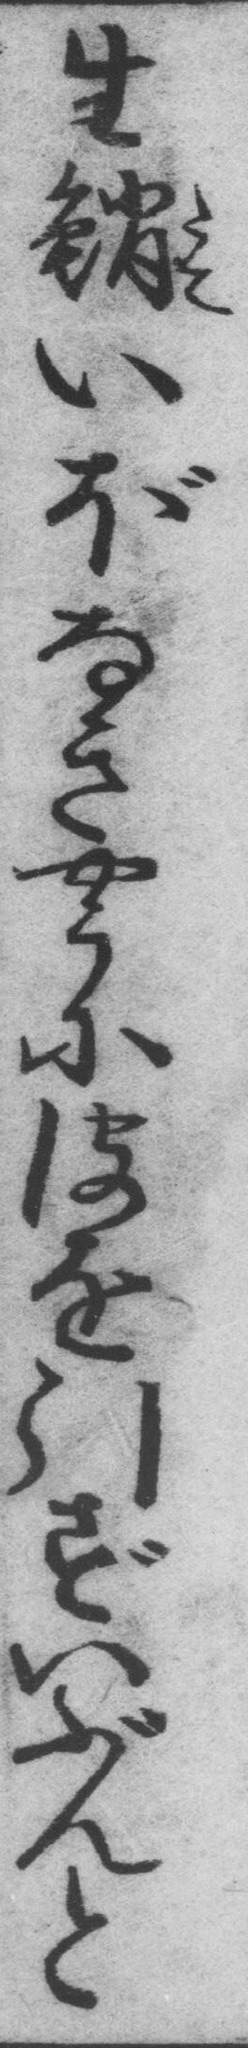生蛸いぼなきやうに皮を引ずいぶんと

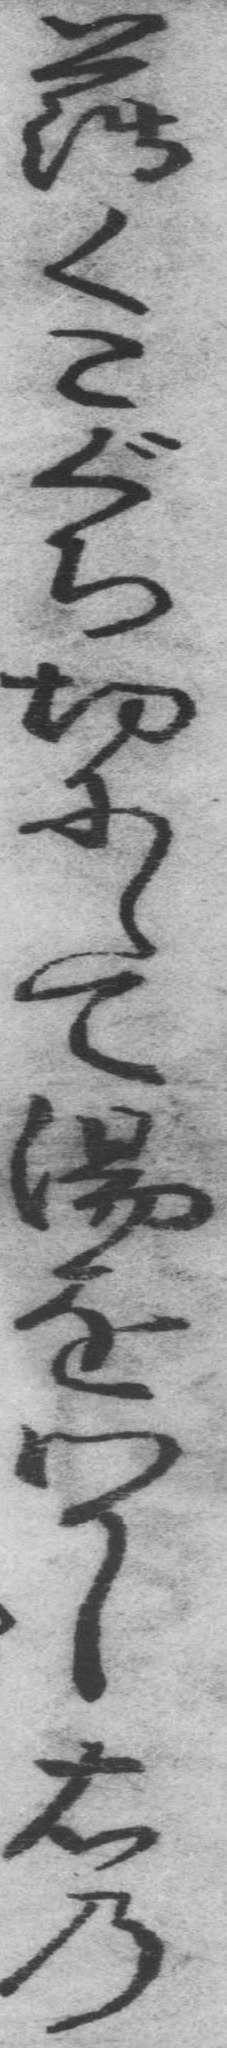薄くこぐち切にして湯をわかし右の
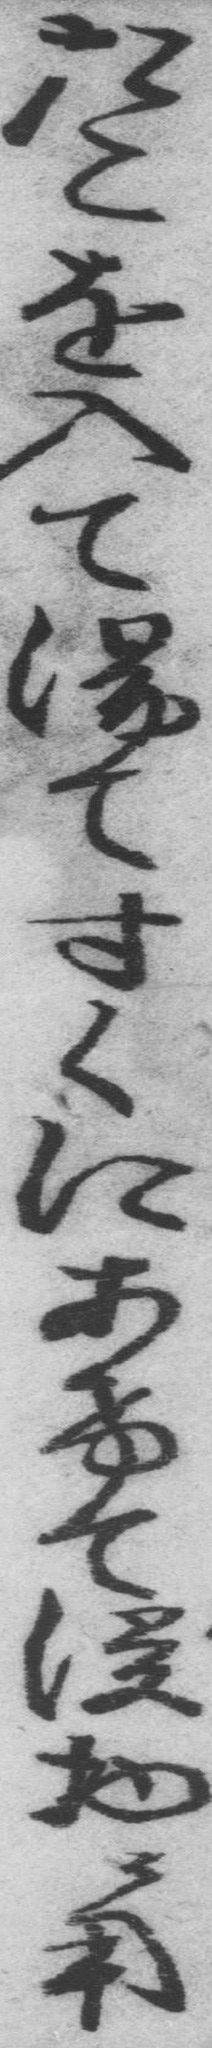たこを入て湯てすくにあけて浸物に用
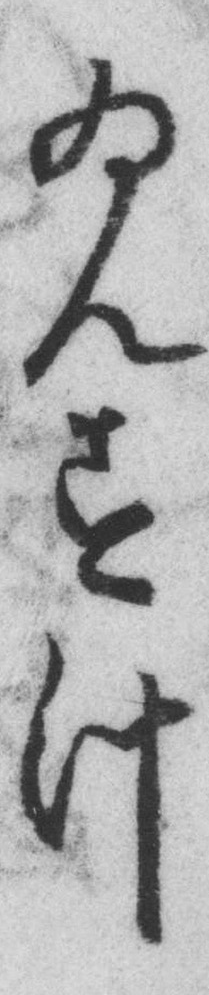ゐんす汁
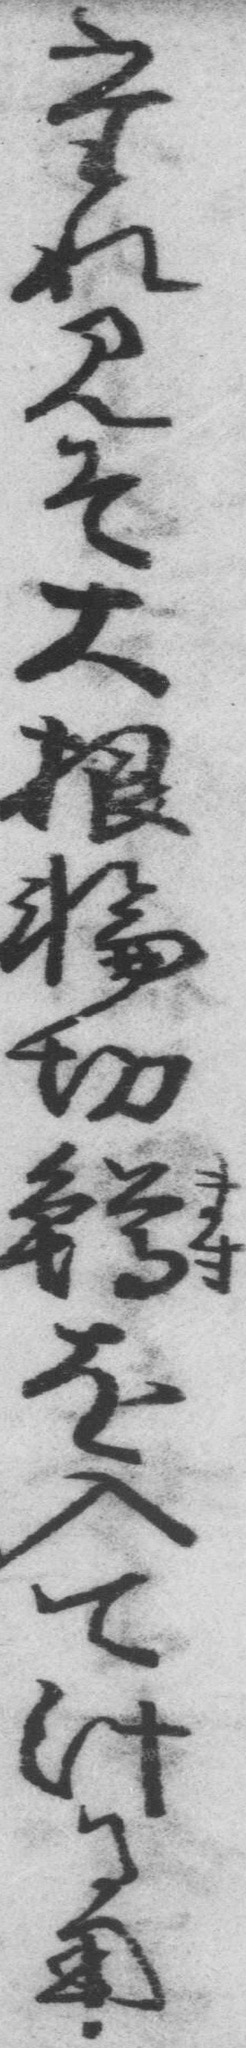たれみそ大根輪切鱒を入て汁に用
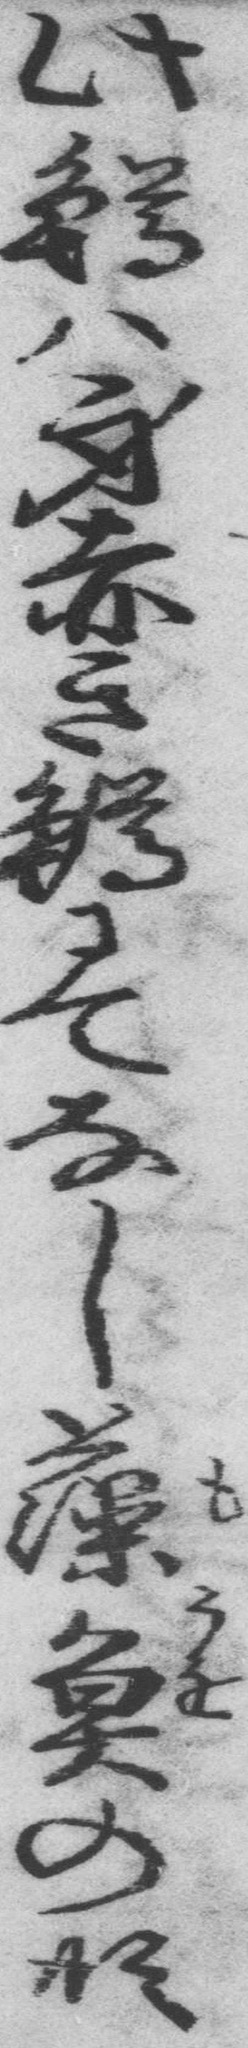此鱒は身赤き鱒にてなし藻魚の形
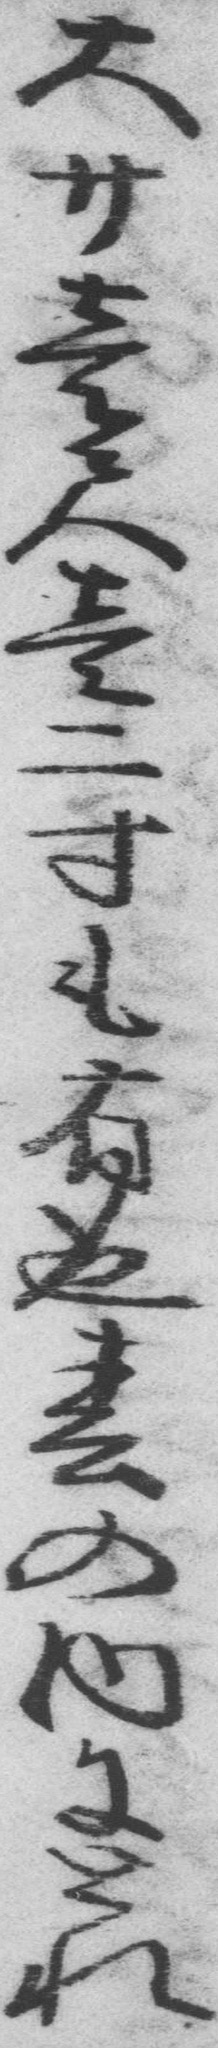大さ壱尺壱二寸も有也春の内にとれ
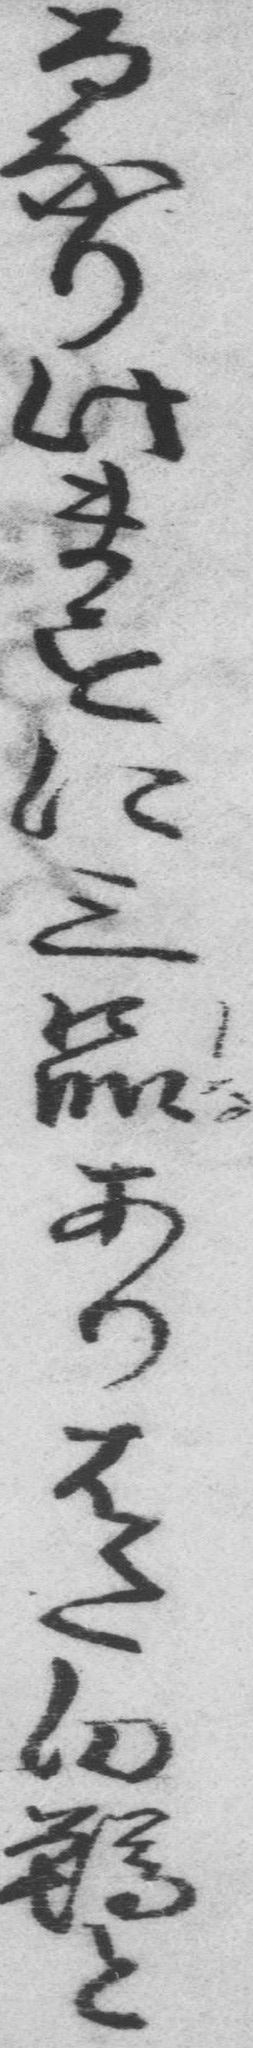るなり此ますに三品ありはた白鱒と
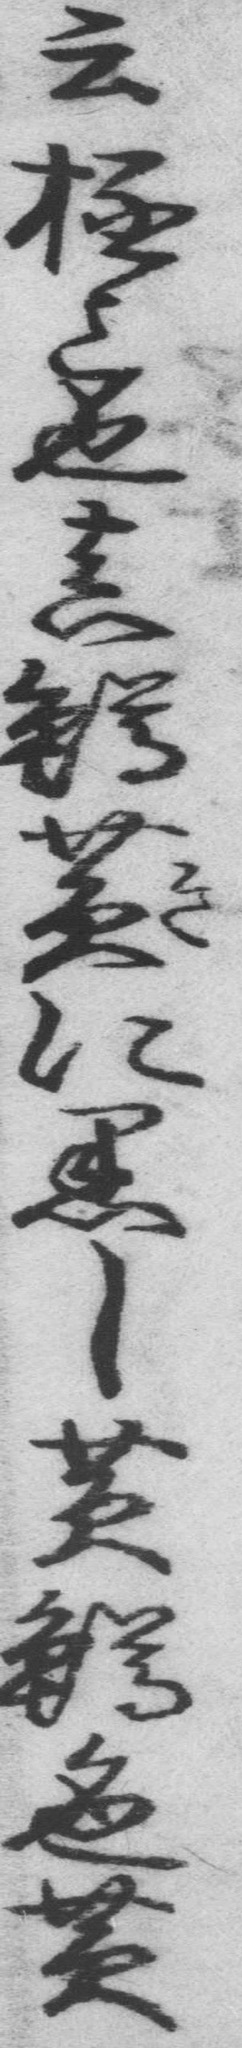云極上也真鱒黄に黒し黄鱒色黄
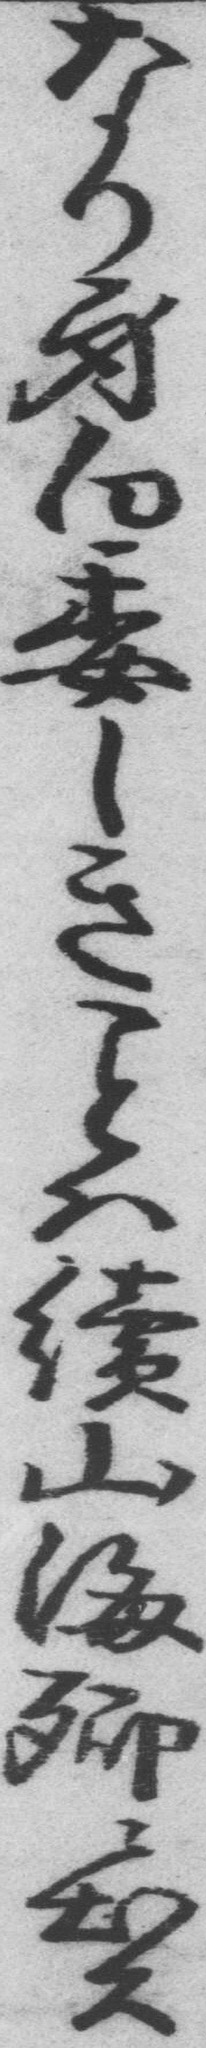なり身白委しきことは続山海郷に出す
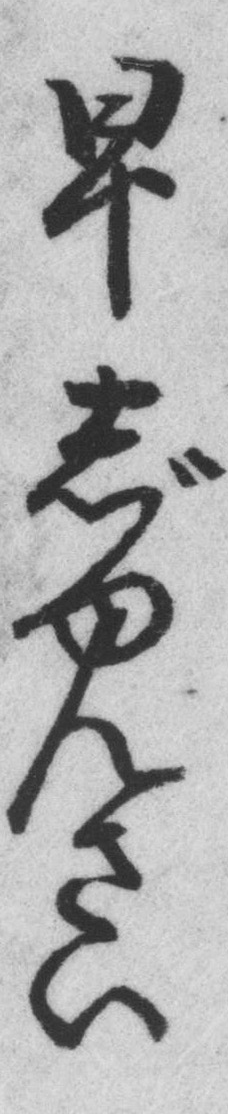早じゆんさい
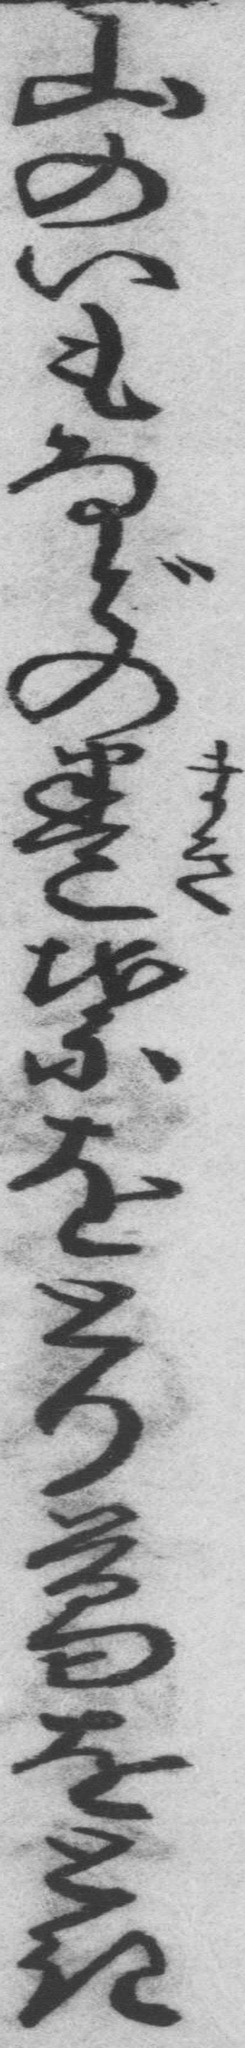山のいもなどの巻葉をとり葛をとき
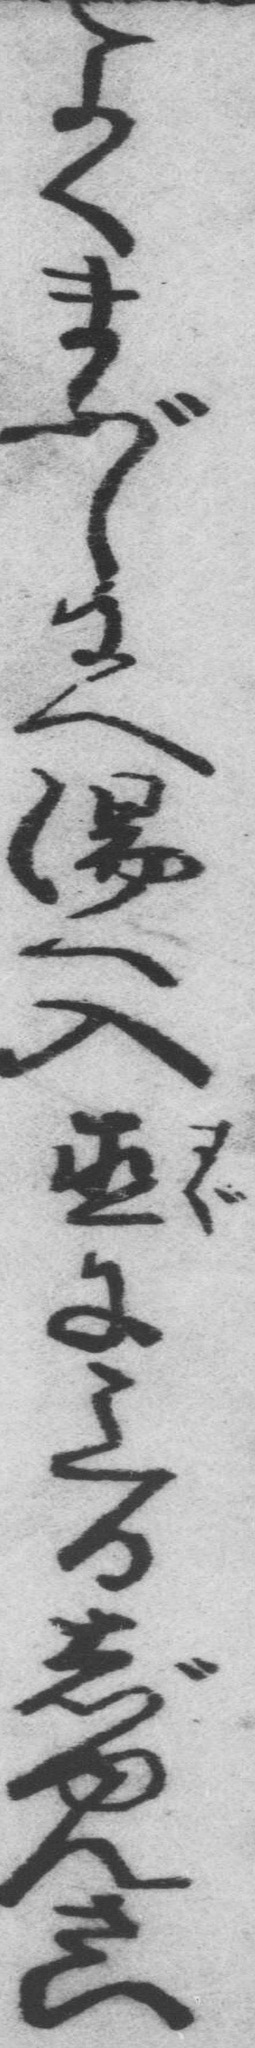よくまぶしにへ湯へ入直に上るじゆんさい
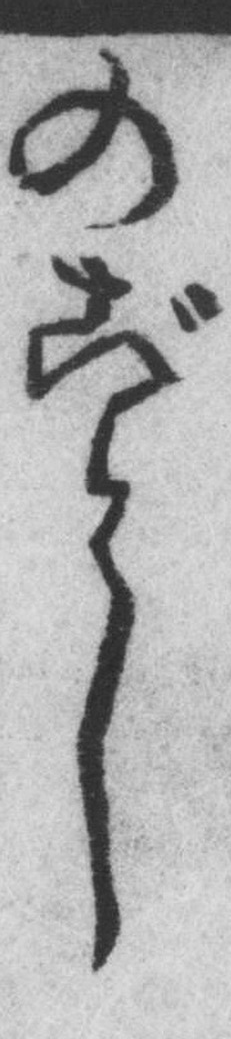のごとし
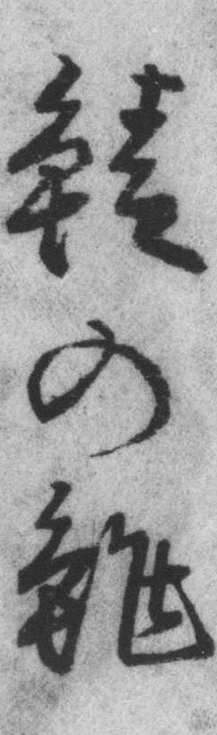鯖の鮓
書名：料理山海郷
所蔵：大阪府立大学学術情報センター 国文学研究資料館
